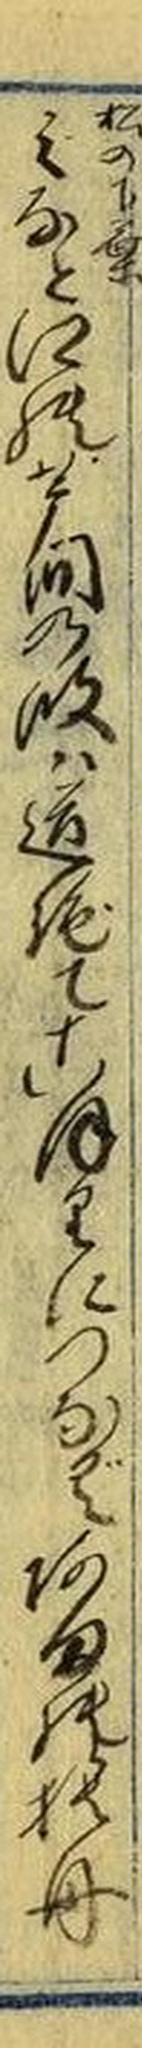みなとえの芦間の波は道絶てこほりにつなぐあまの捨舟
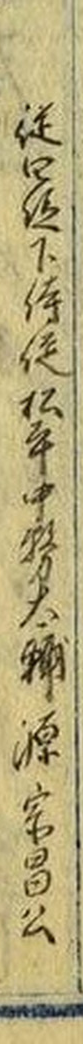豊紀公従四位下侍従中務太輔源宗昌公
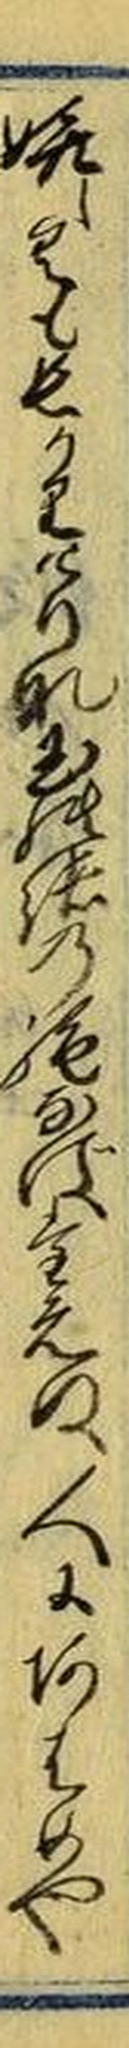嬉しくも長かりけりな玉の緒の絶なばたえね人にあはめや
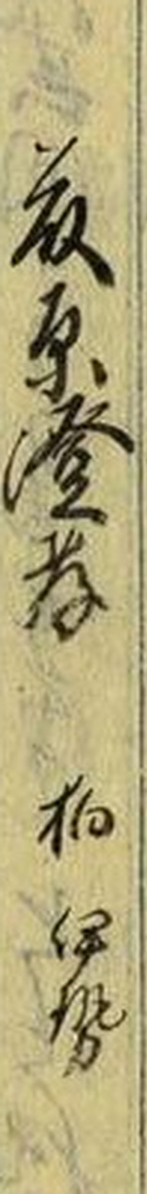藤原澄孝柏伊勢
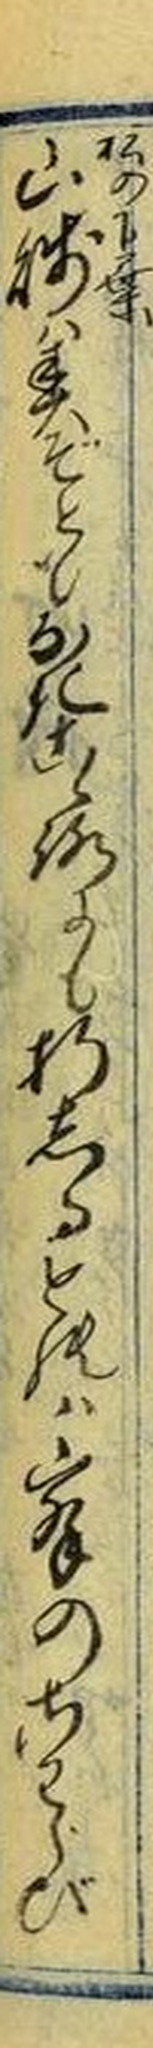山賤は春ぞともなきこゝろにも折しるものは山峯のさわらび
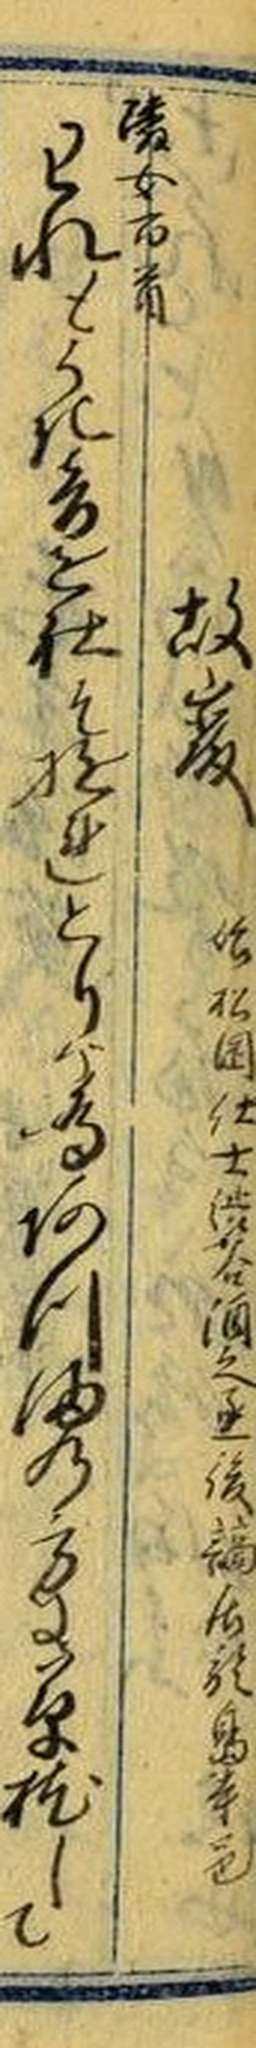われもうき音を社そゆれとりは鳴あつまの方に草枕して
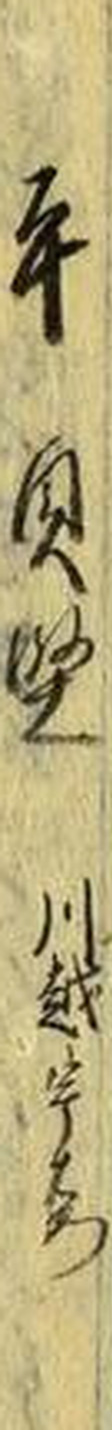平貞堅川越宇右衛門
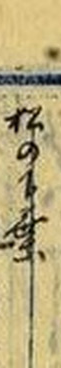松の下葉
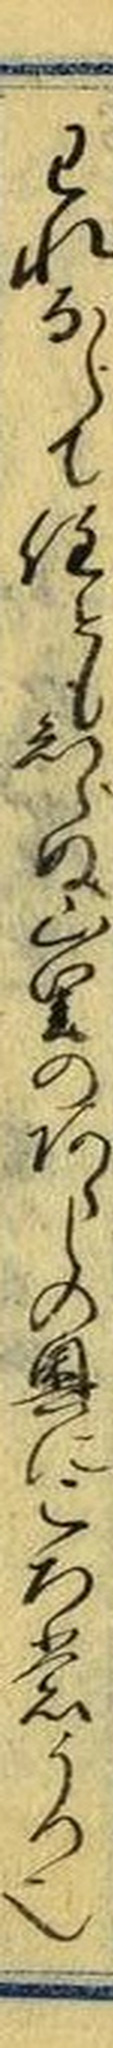われならて住とも知らぬ山里のあらしの奥にころもうつ也
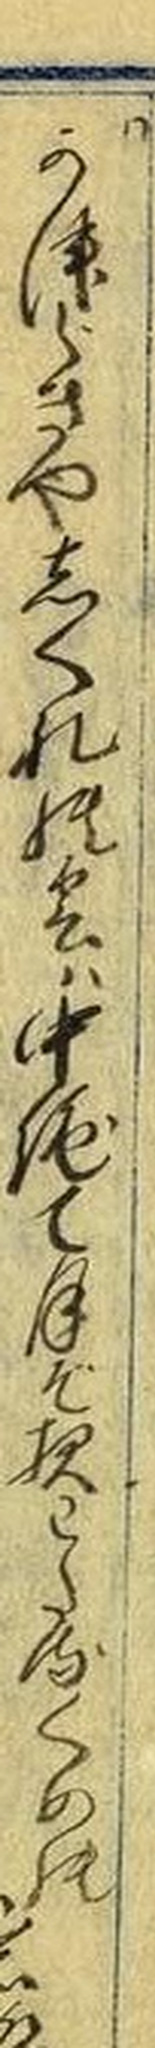かつらきやしくれの雲は中絶て月ぞ夜わたるくめの岩橋
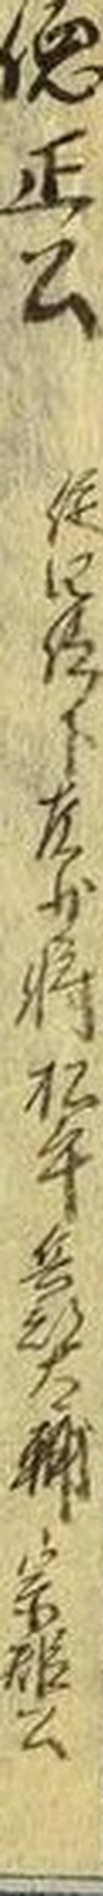徳正公従四位下左少将松平兵部大輔宗矩公
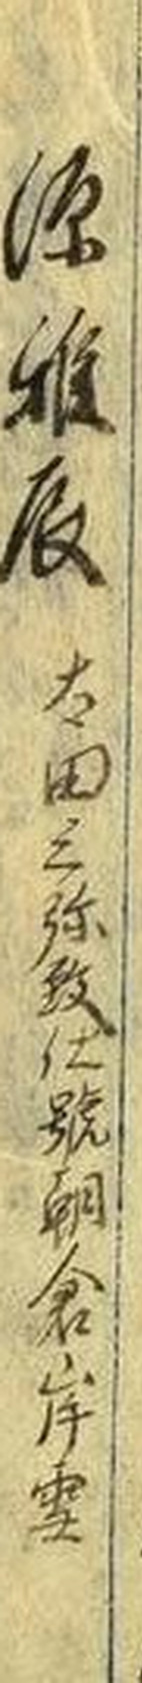源雅辰太田三弥致仕號朝倉岸雪
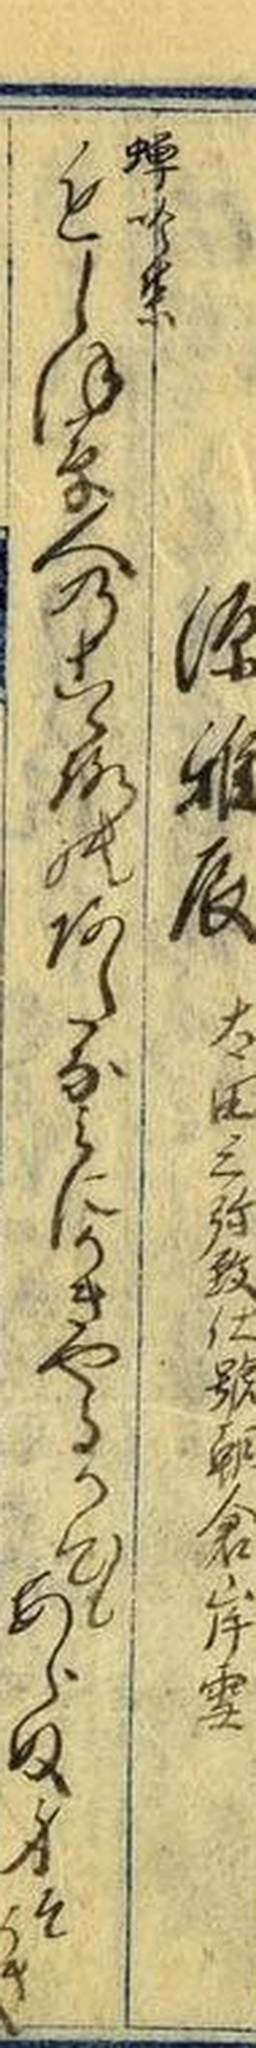もしほ草人のこゝろのあたなみにかきやるかひもあらぬ身そうき

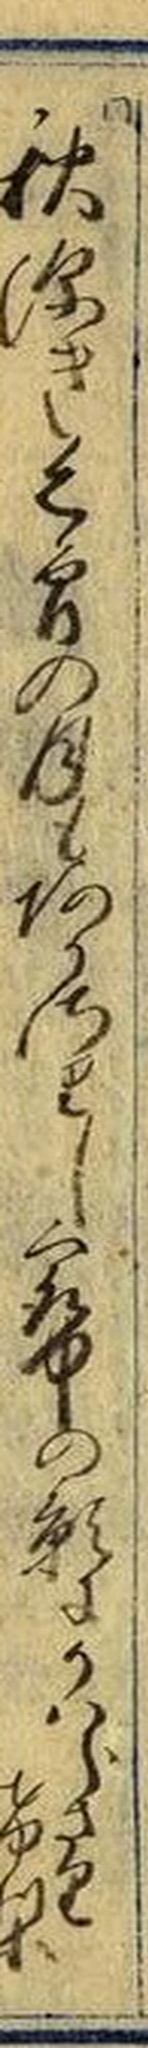秋深き今宵の月もあかさりし最中の影にかはらさりけり
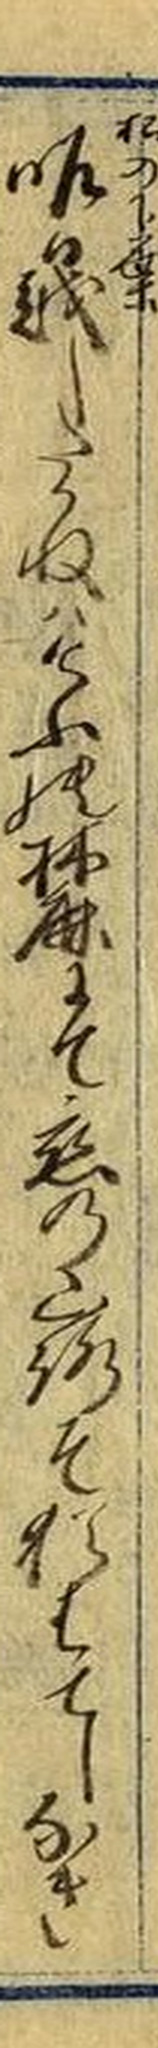昨日越したらねはけふの麓にて恋の山路そ猶はてしなき
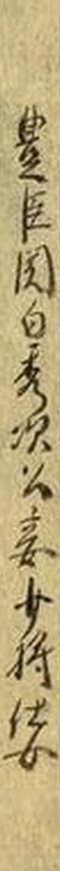うらの豊臣関白秀次公妾少将仕女
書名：温古集 三巻
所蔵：福井県文書館 Fukui Prefectural Archives
